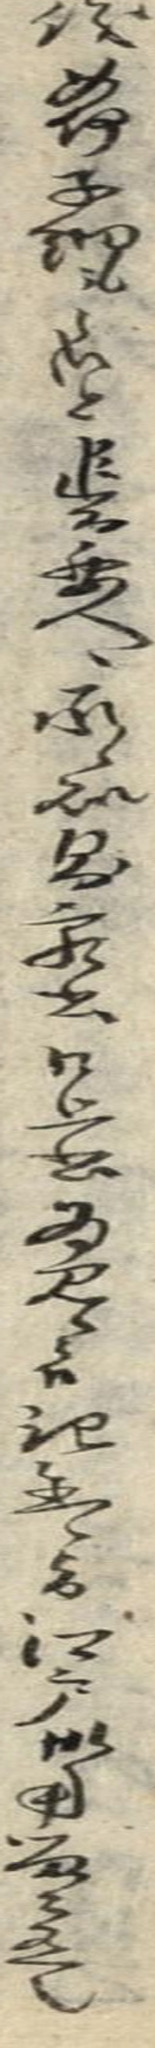儀如何子細も候哉と追而要人へ承候処即願書口上書為見候ニ付記置候旨江戸御用留ニ有之
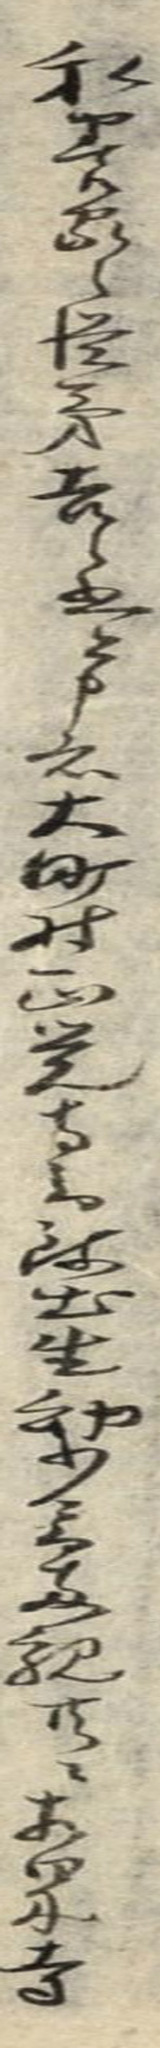私養家之従弟吉之丞と申者大町村正覚寺ニ而致出生幼少ニ而両親共ニ相果寺
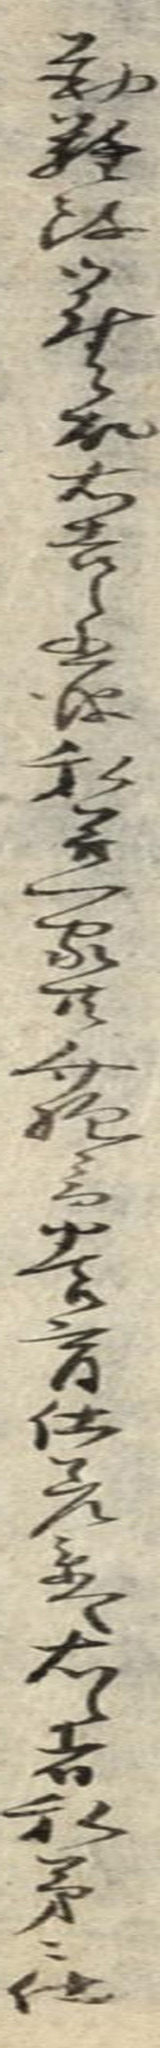勤難致御座候故右吉之丞儀私并一家共介抱ニ而養育仕差置候右之者私弟ニ仕
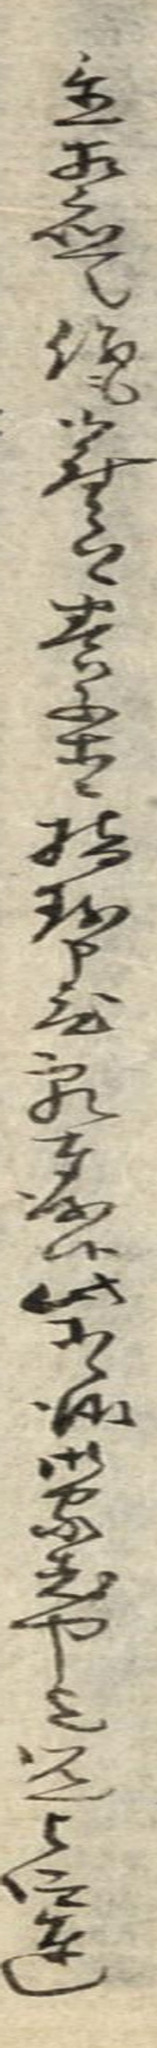置相応之儀も御座候ハヽ養子等ニ指越申度願奉存候此等之趣御家老中迄宜被仰達
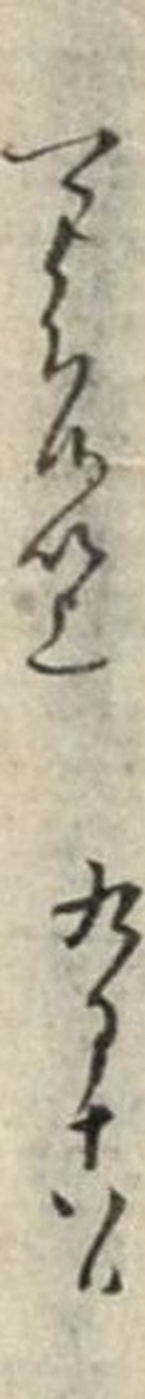可被下候以上九月十八日
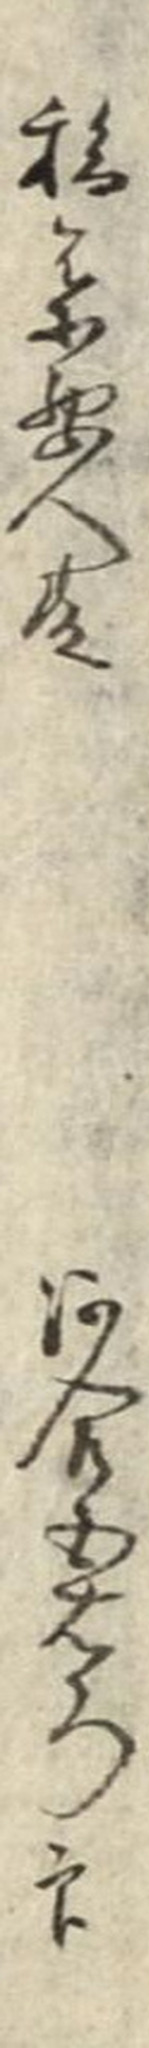稲葉要人殿河合五右衛門印
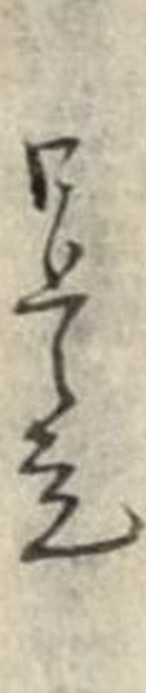口上之覚
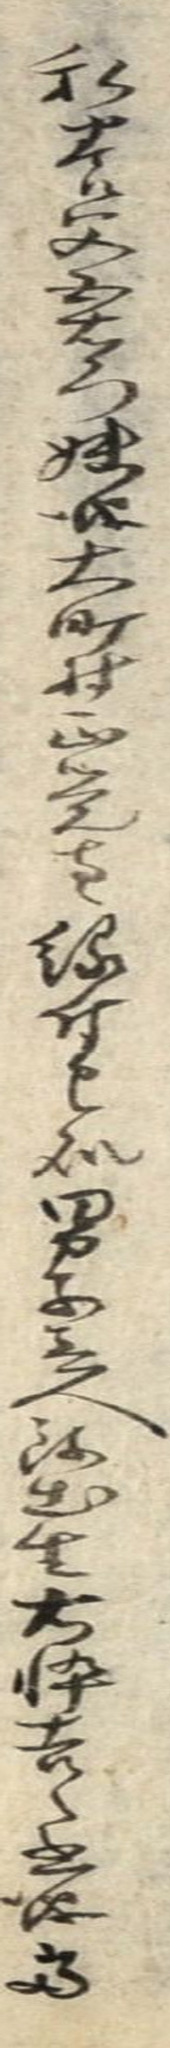私養父五右衛門妹儀大町村正覚寺へ縁付申候処男子壱人致出生右忰吉之丞儀当
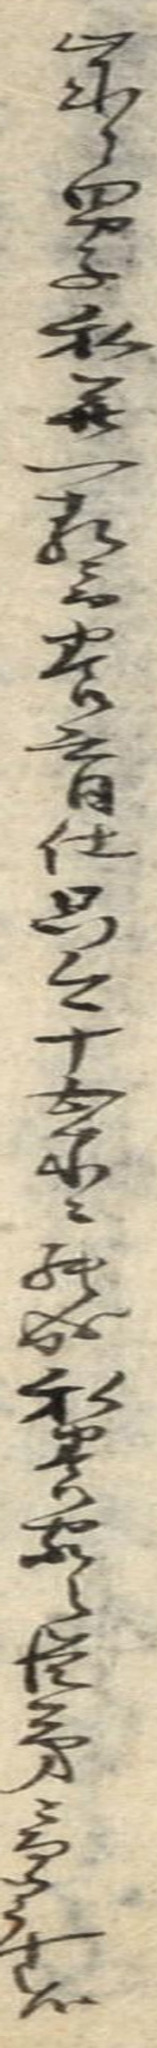歳之男子私并一類ニ而養育仕只今十五歳ニ罷成私養家之従弟ニ而御座候
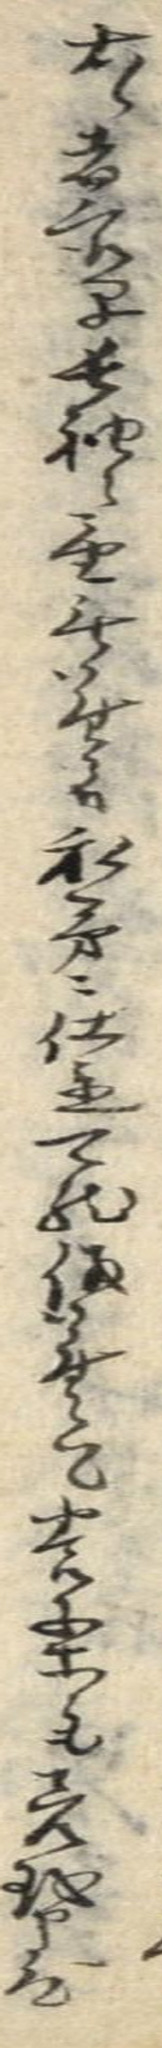右之者最早長袖之届無御座ニ付私弟ニ仕置可然儀御座候ハヽ養子等も差越申度

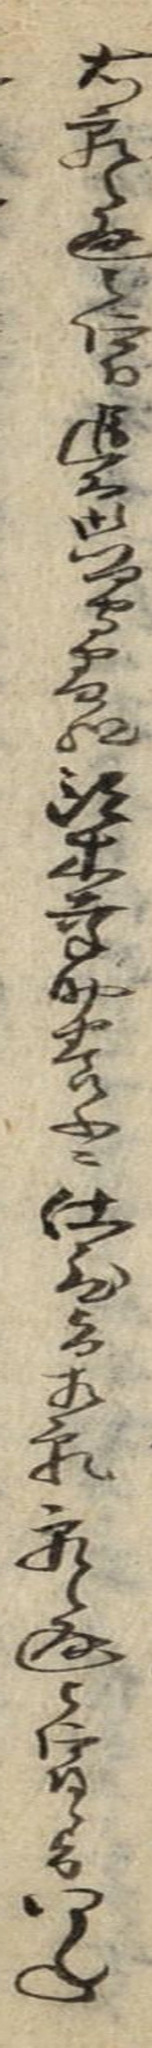右願之通被仰付追而御留守番組鈴木幸助養子ニ仕度旨相願願之通被仰付候旨同年
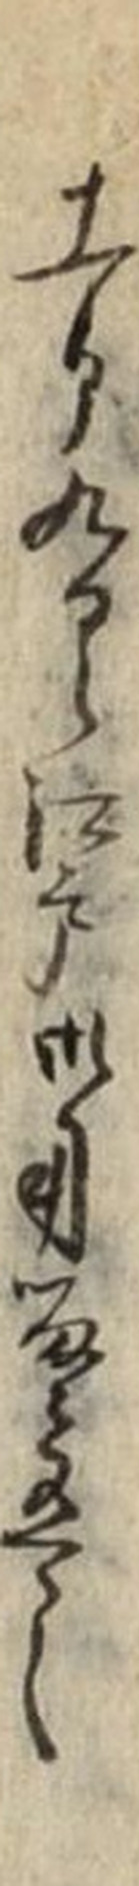十一月九日江戸御用留ニ有之
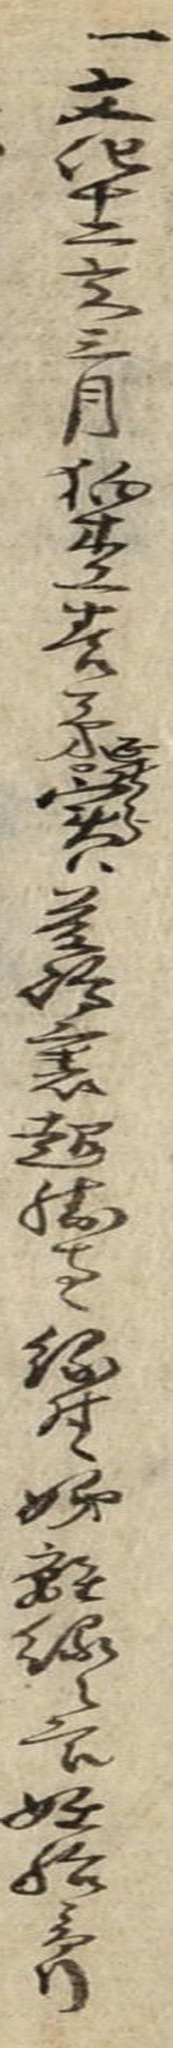一文化十二亥三月狛木工養弟◦延次郎実ハ藤嶋裏超勝寺へ縁付候姉離縁之節妊胎ニ而引
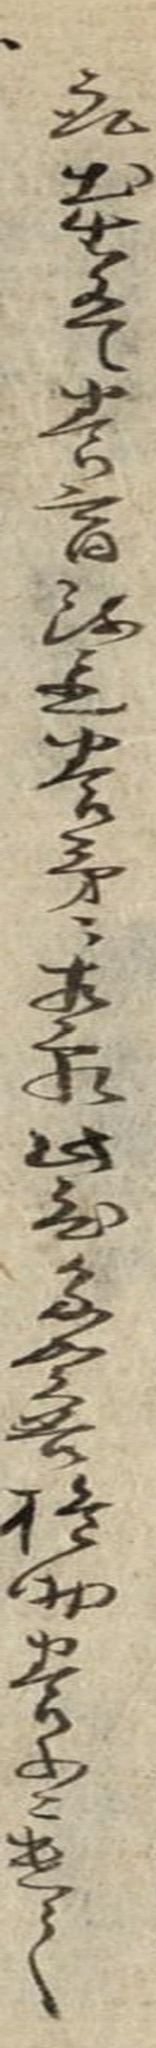取出生有之養育致置養弟ニ相願此度多賀谷権助養子ニ遣之
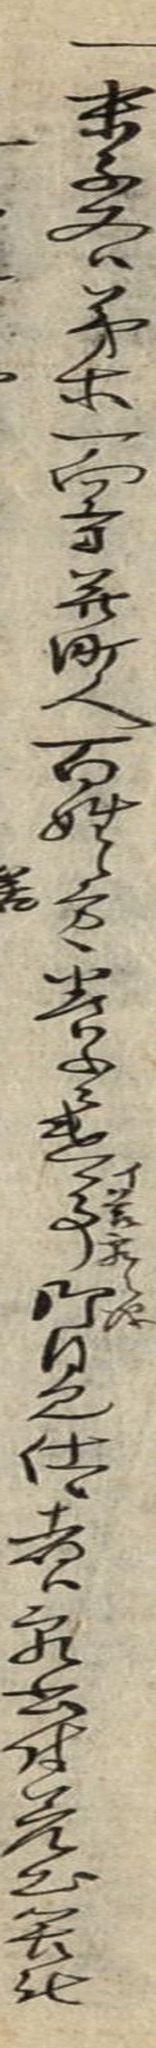一末子又ハ弟等一向寺并町人百姓之方へ養子ニ遣候事御目見仕候者ハ願書付差出筈被
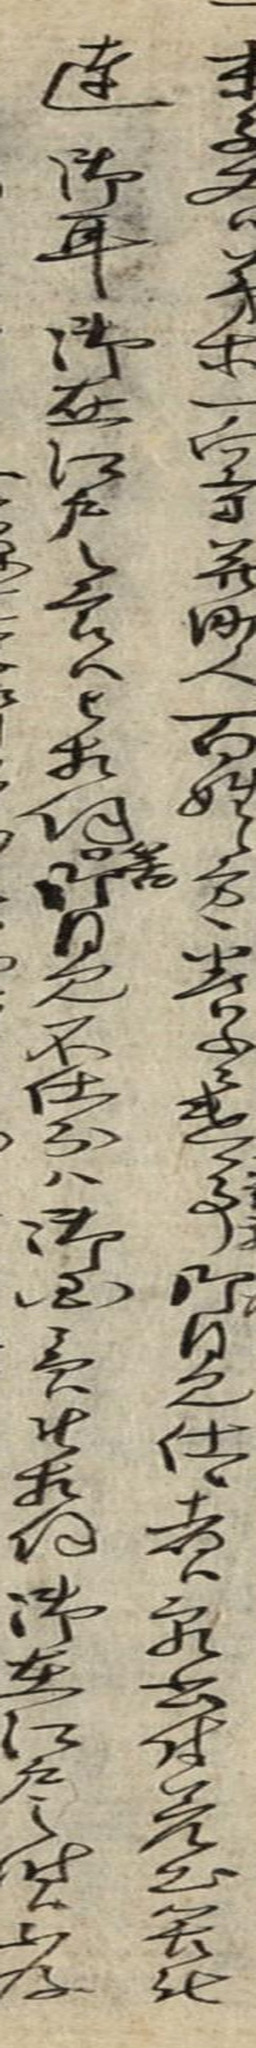達御耳御在江戸之節ハ被相伺筈御目見不仕分ハ御国ニ而ハ相伺御在江戸之時ハ不及
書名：養子縁組之部
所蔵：福井県文書館 Fukui Prefectural Archives
